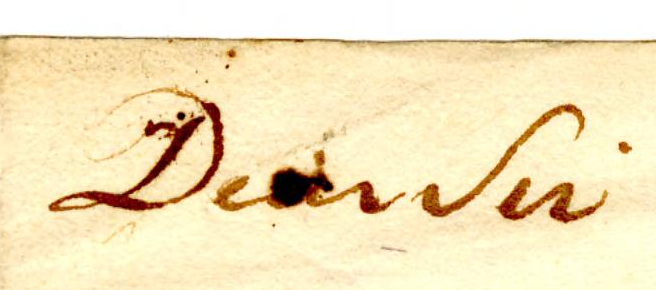Dear Sir
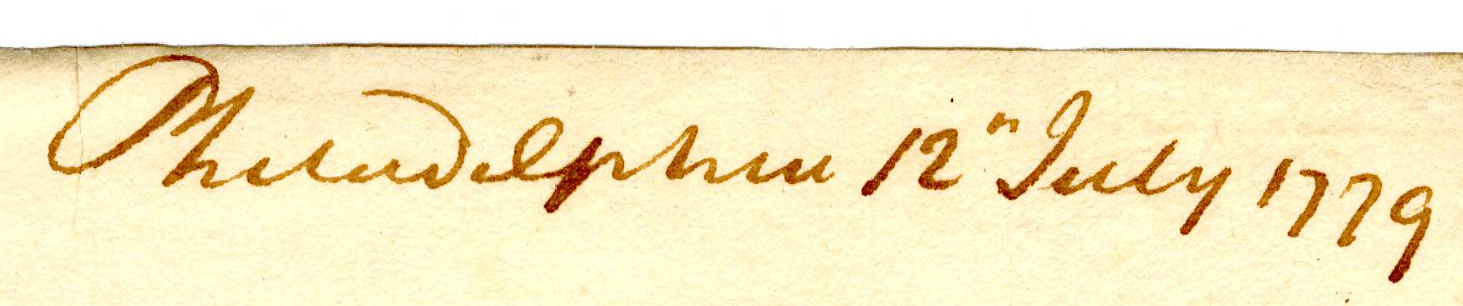Philadelphia 12^h July 1779
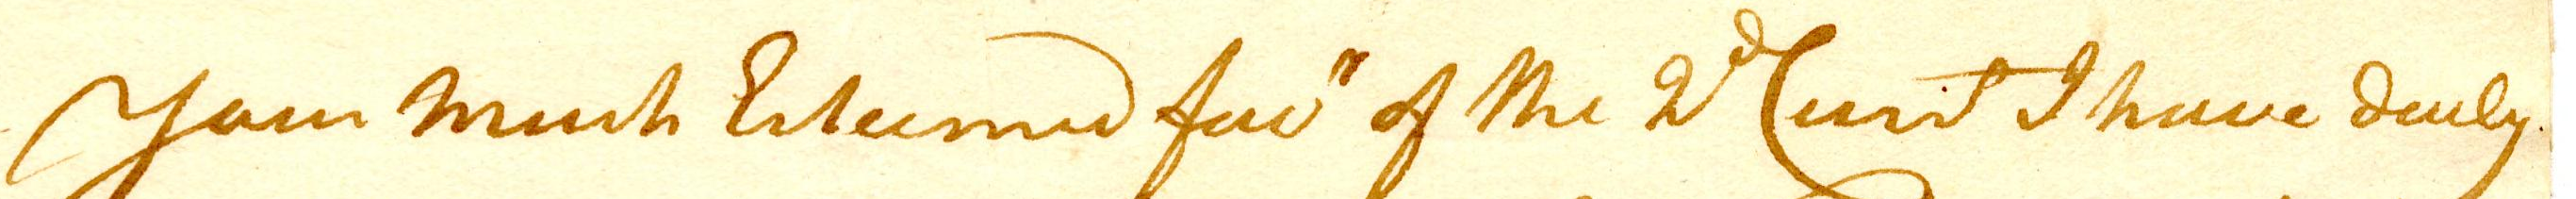Your much Esteemed fav^r of the 2^d Curr^t I have duly
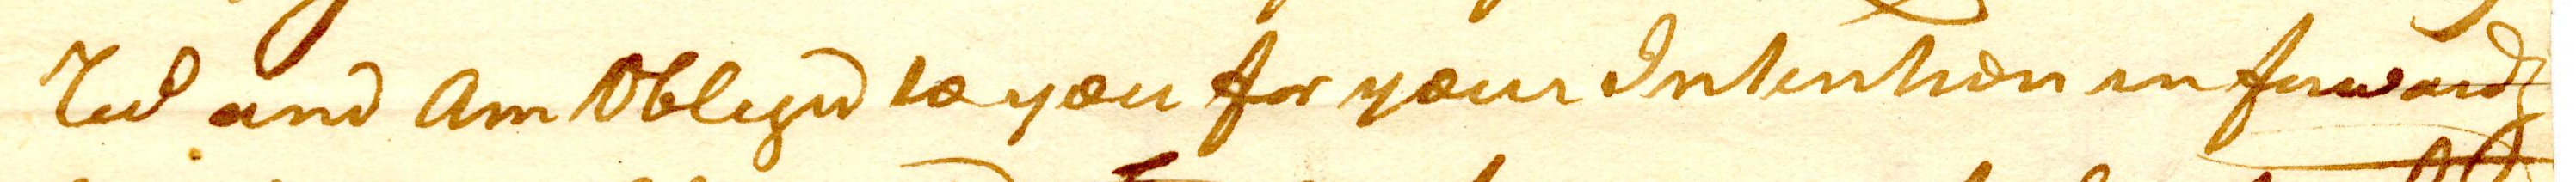rec^d and am Obliged to you for your Intention in forwardg
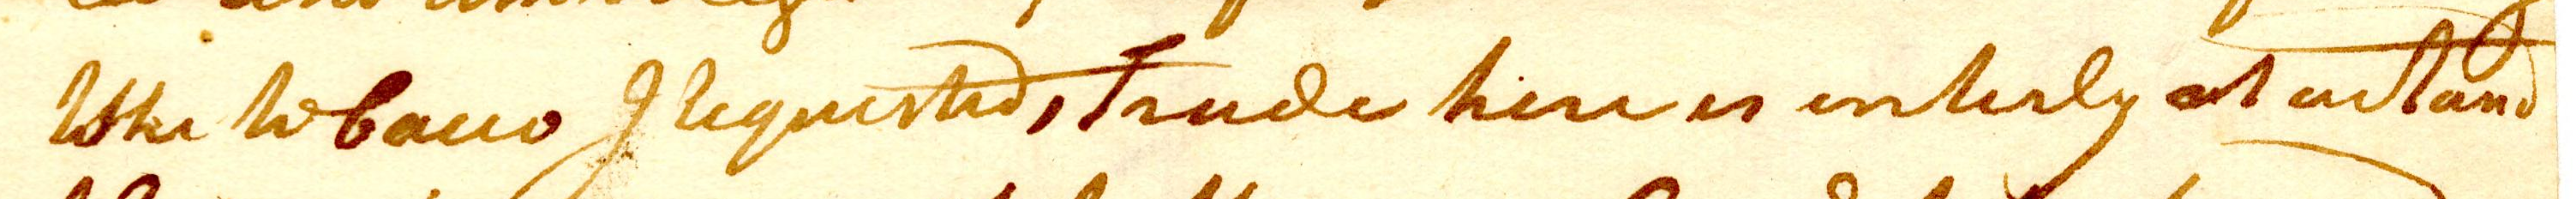the tobacco I requested, trade here is entirly at a stand
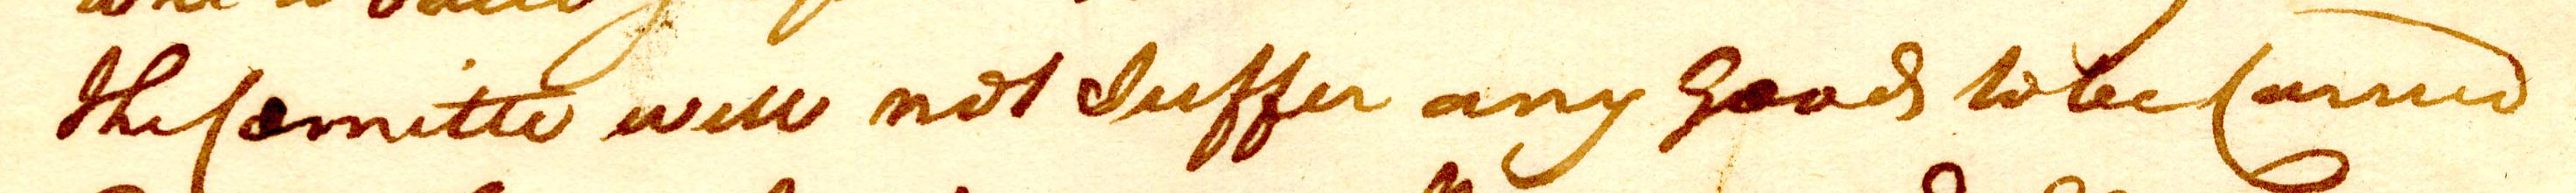the Comitte will not Suffer any goods to be Carried
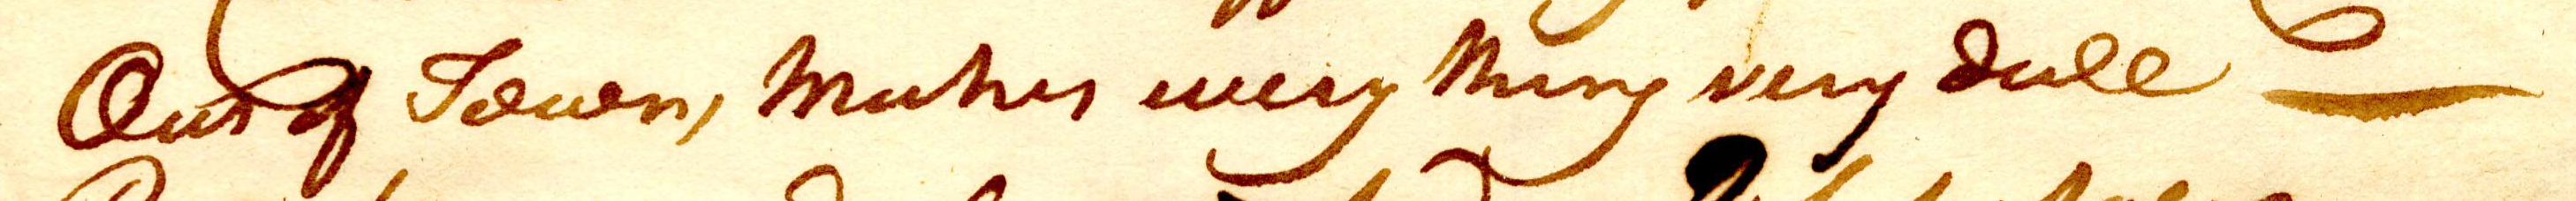out of town, makes everything very dul.-
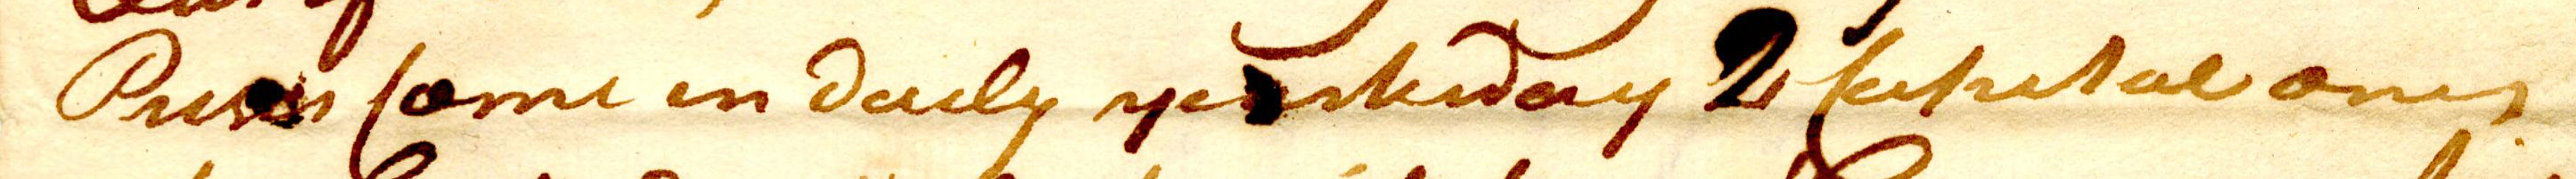Prices Come in daily yesterday 2 Capital ones
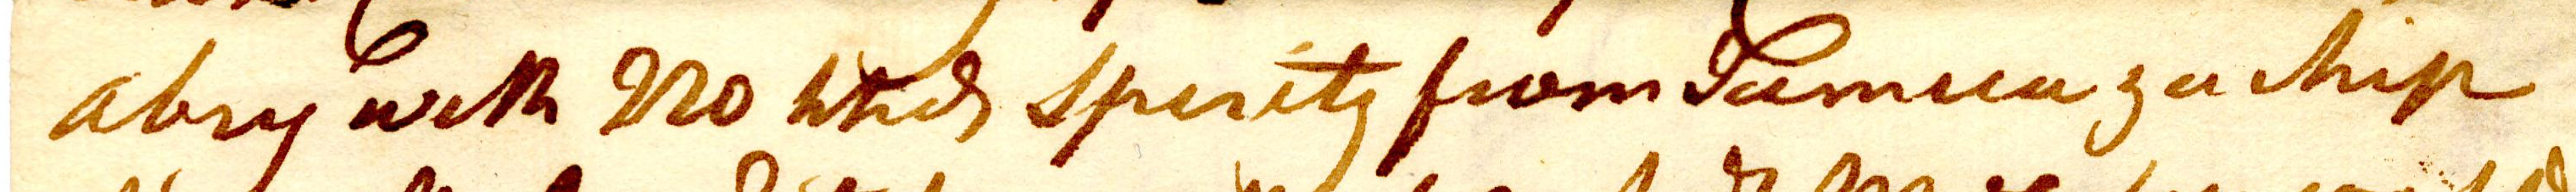a brig with 220 hhds speritz from Jameca & a ship
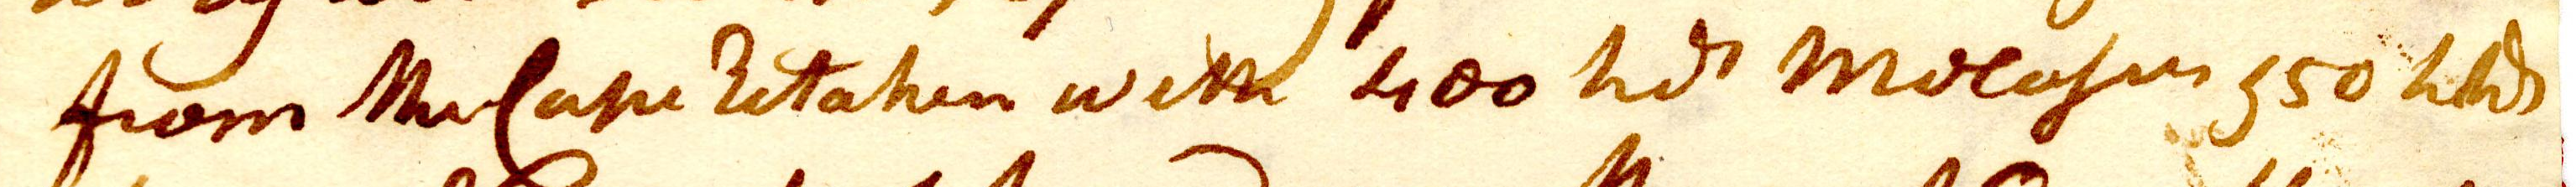from the Cape retaken with 400 hd^s Molasses 550 hh^s
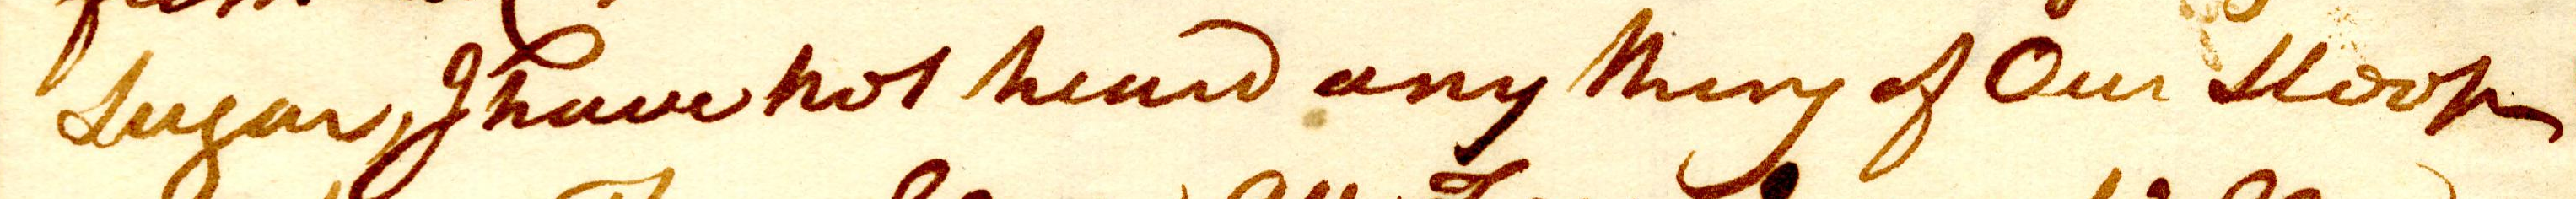Sugar I have not heard any thing of Our sloop
